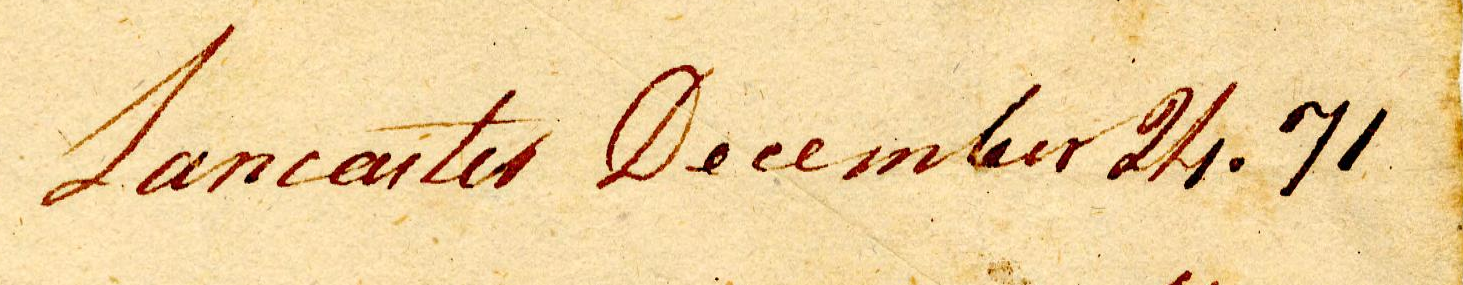Lancaster December 24. 71
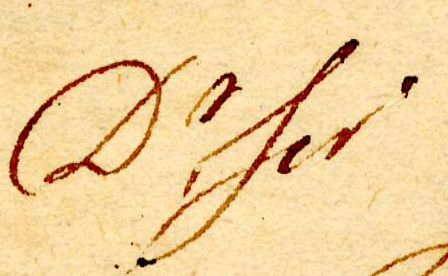D^r. sir
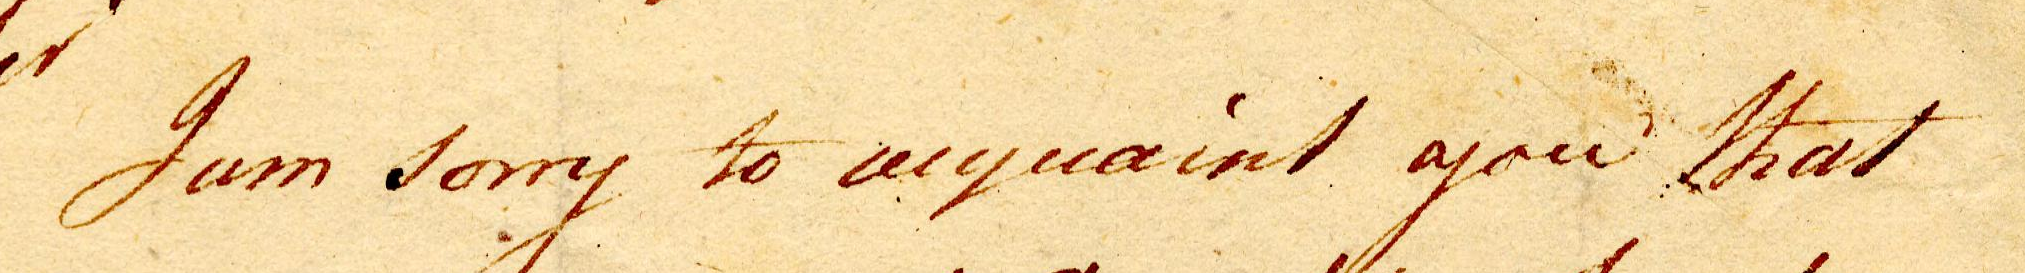I am sorry to acquaint you that
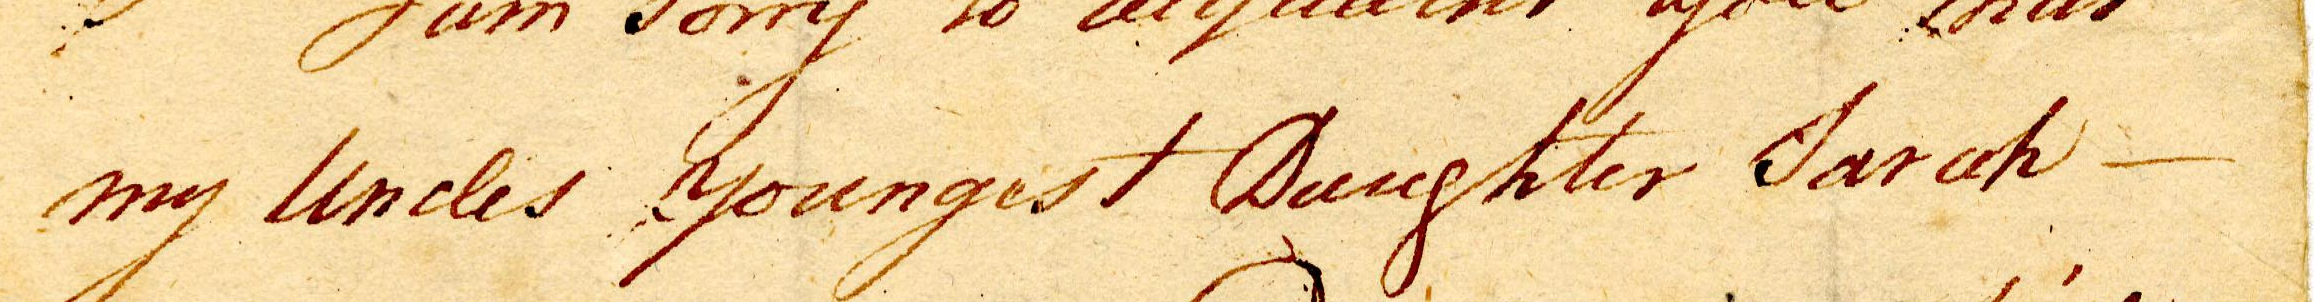my Uncles Youngest Daughter Sarah-
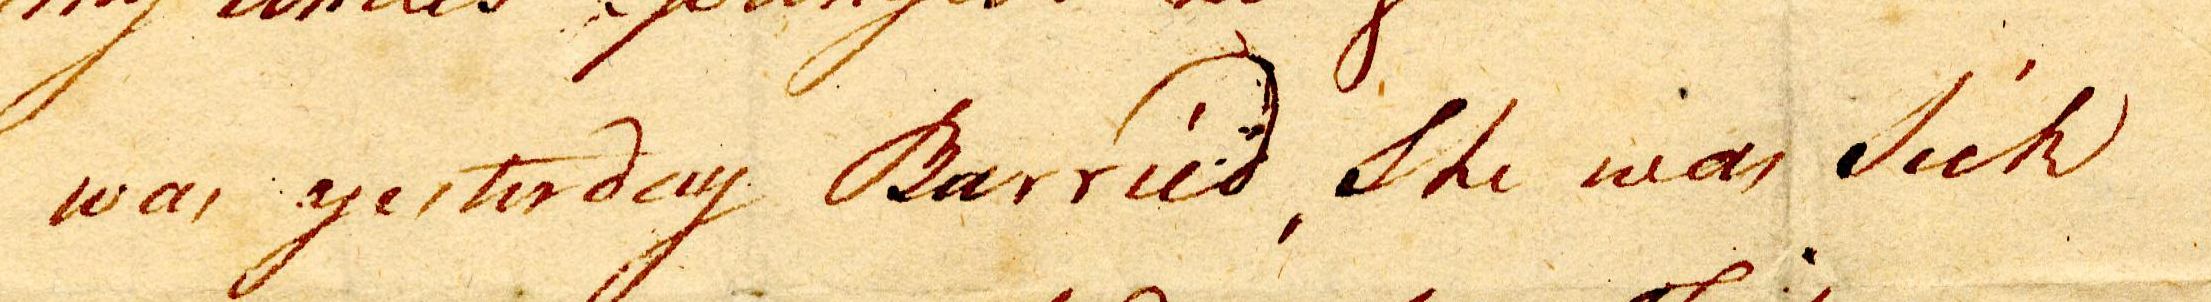was yesterday Burried, She was sick
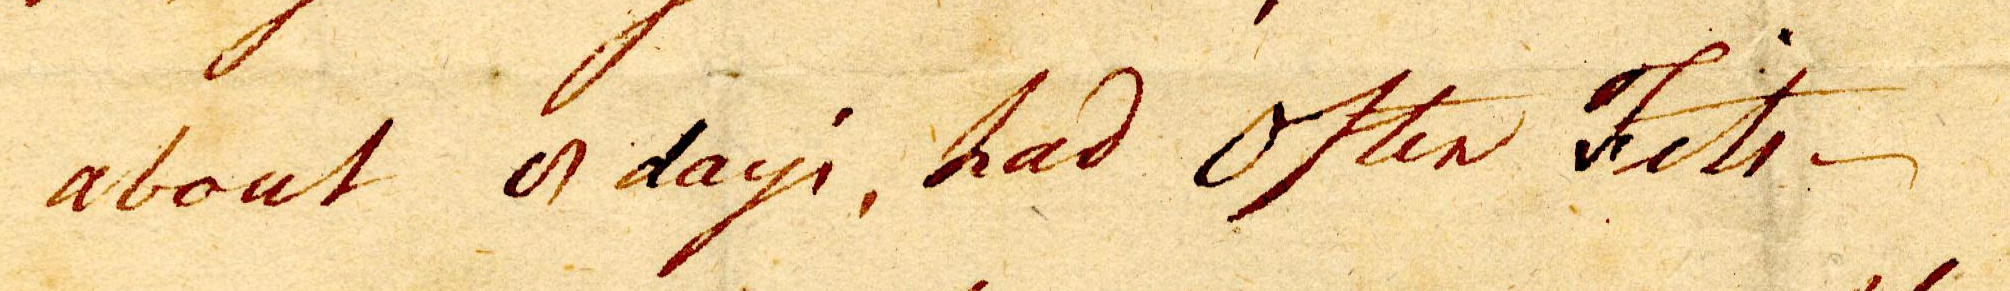about 8 day's, had Often Fits-
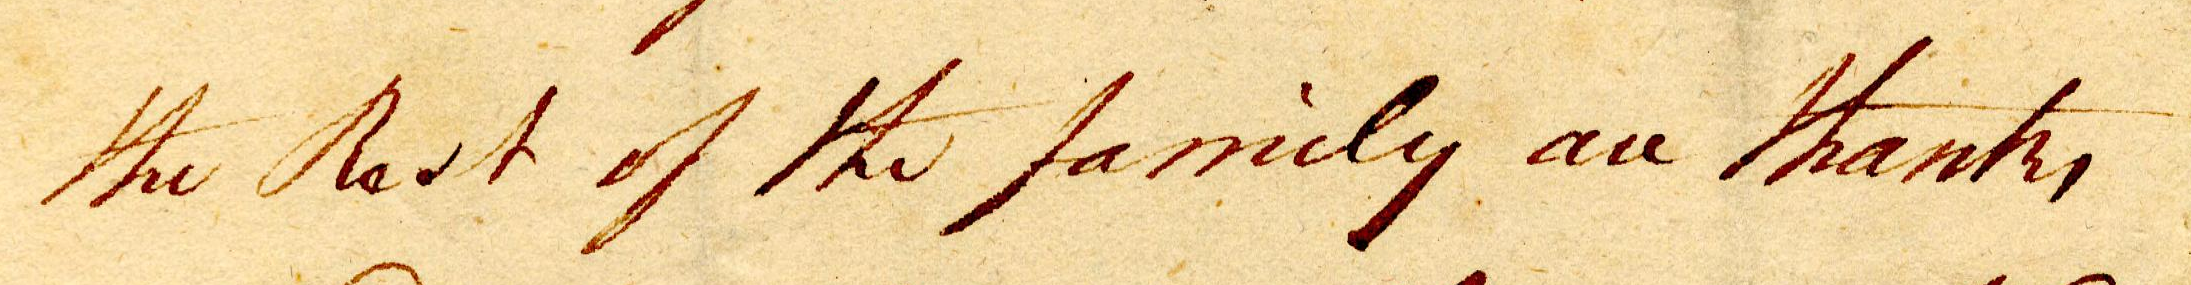the Rest of the family are thanks
